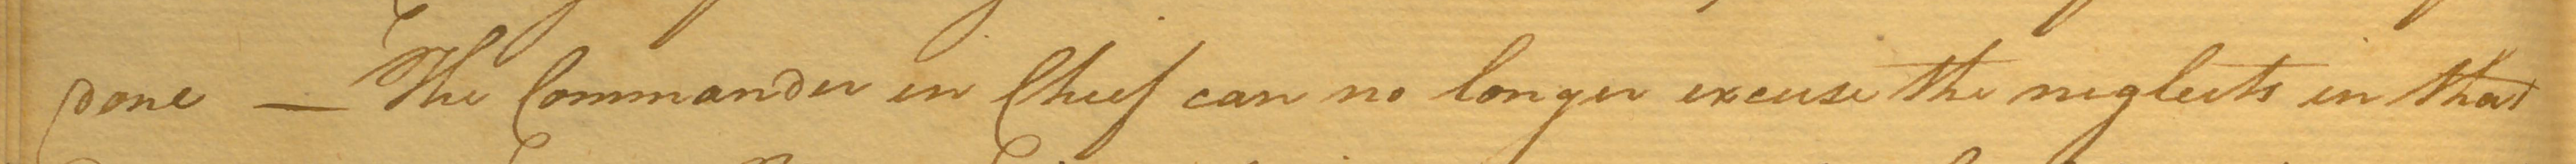done- The Commander in Chief can no longer excuse the neglects in that
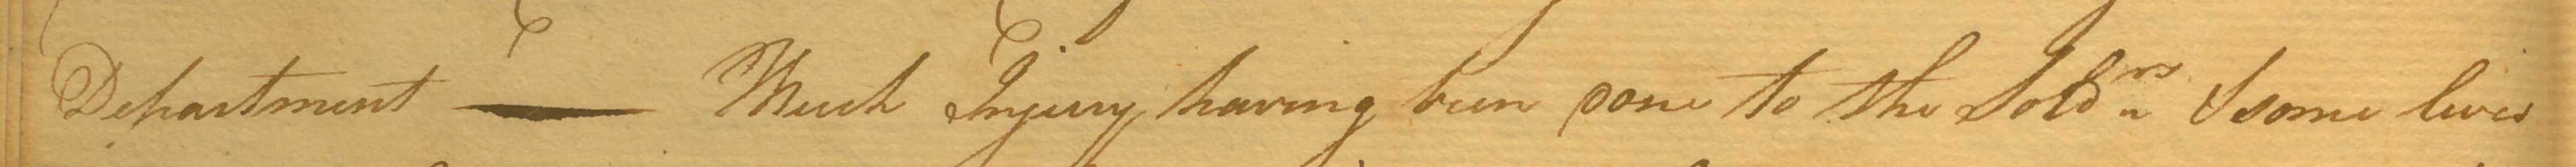Department- Much Injury having been done to the Sold^rs. & some lives
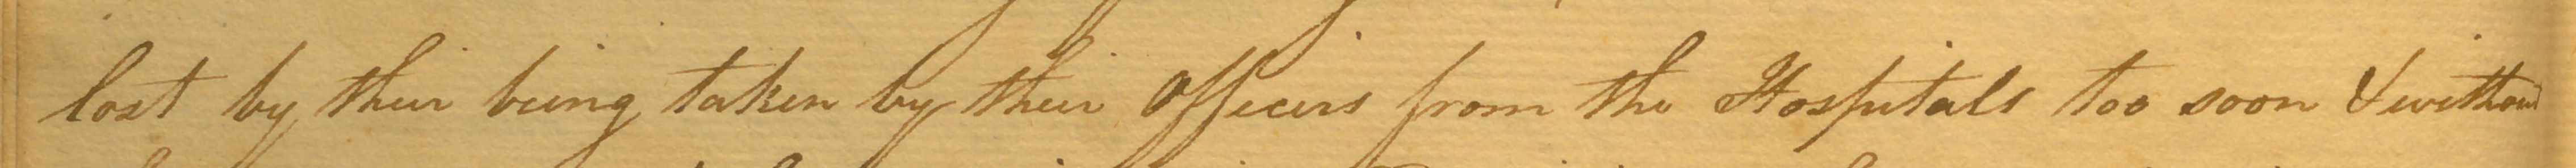lost by their being taken by their Officers from the Hospitals too soon & without
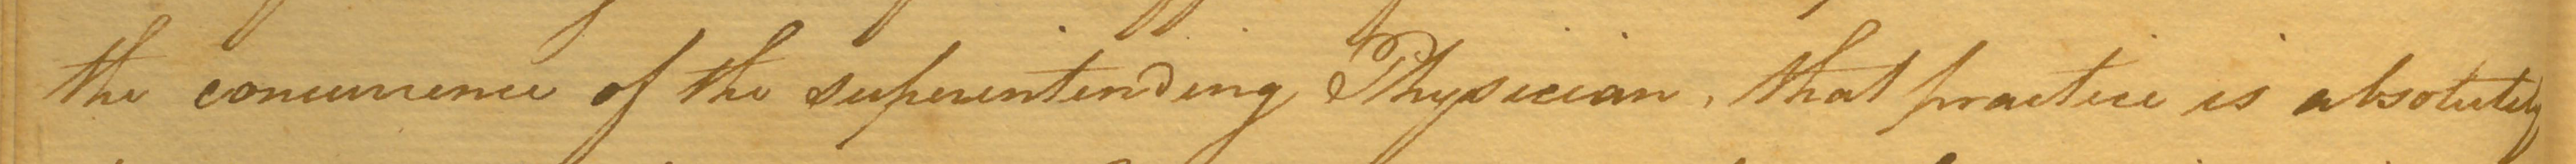the concurrence of he superintending Physician, that practice is absolutely
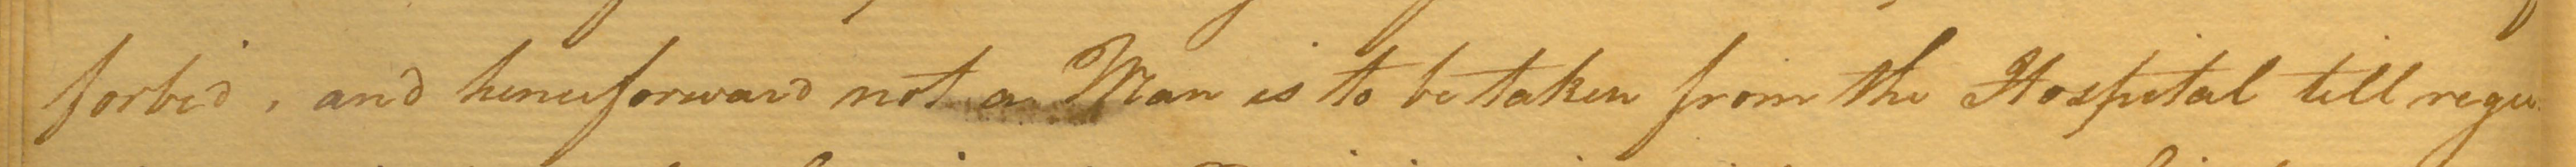forbid, and henceforward not a Man is to be taken from the Hospital till regu
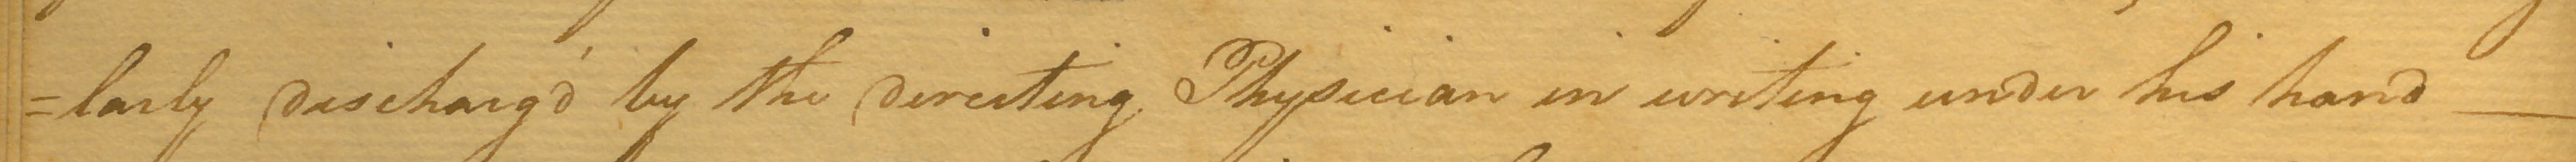-larly discharg'd by the directing Physician in writing under his hand-
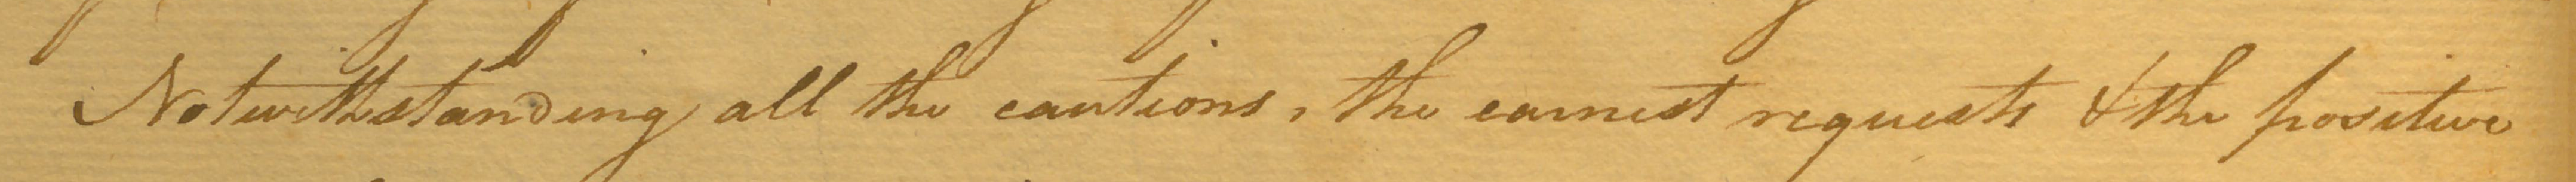Notwithstanding all the cautions, the earnest requests & the positive
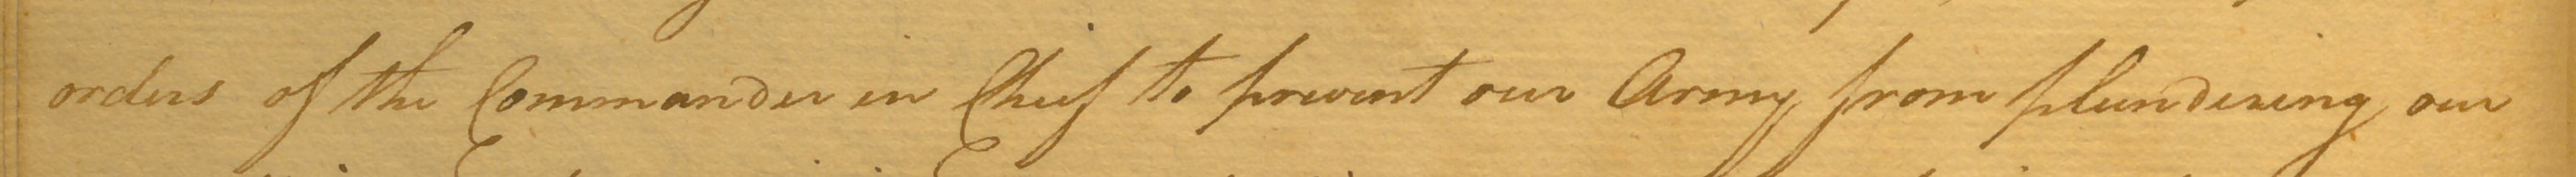orders of the Commander in Chief to prevent our Army from plundering our
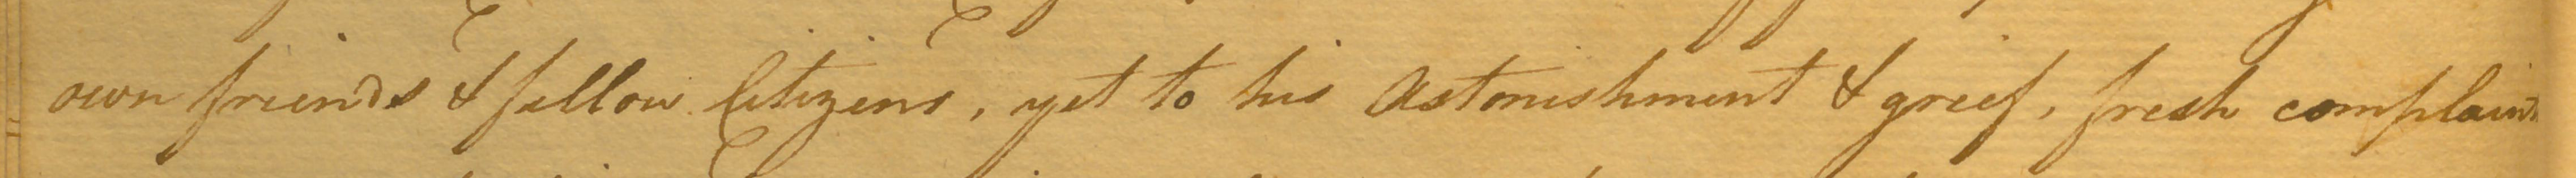own friends & fellow Citizens, yet to his Astonishment & grief, fresh complaints
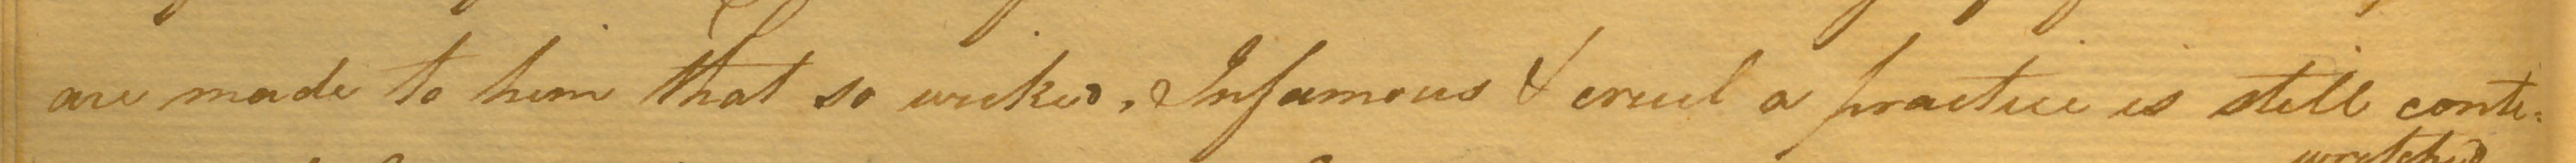are made to him that so wicked, Infamous & cruel a practice is still conti-
